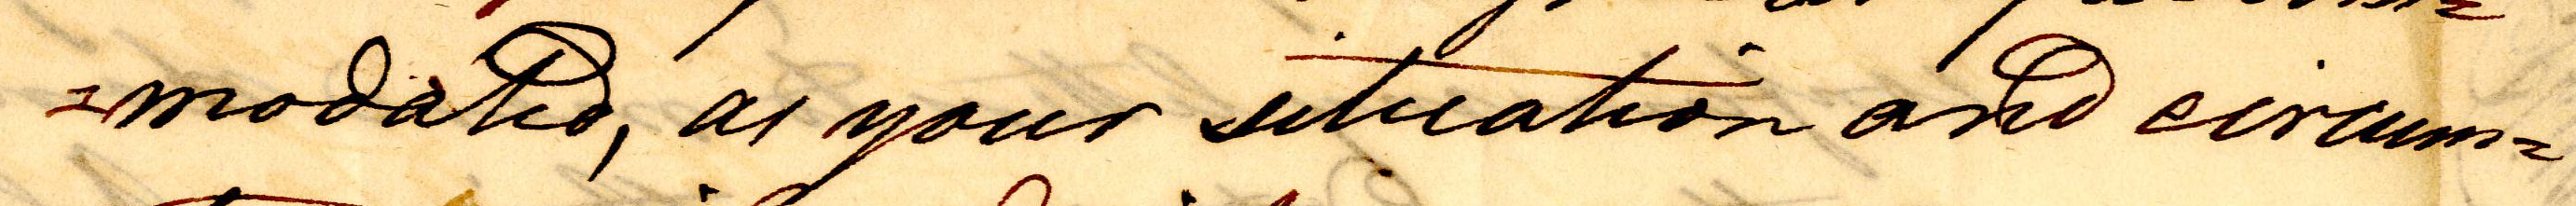-modated, as your situation and circum-
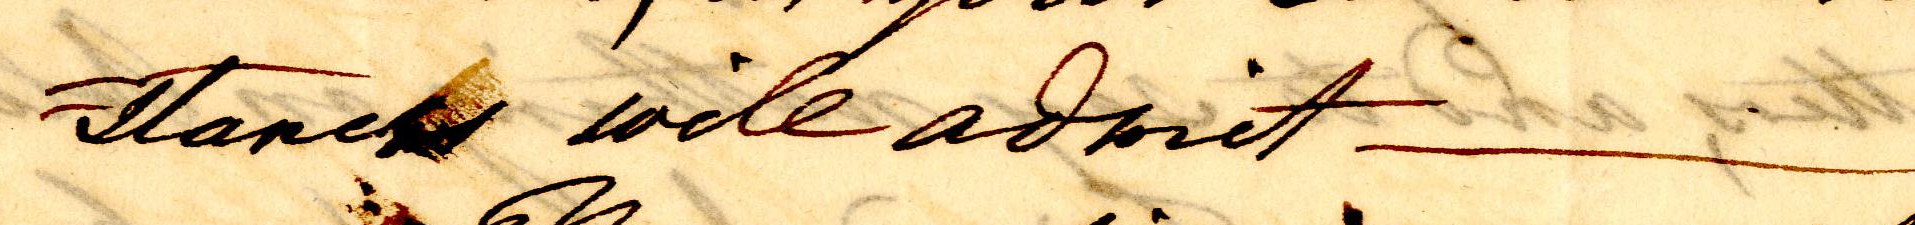-stance will admit-
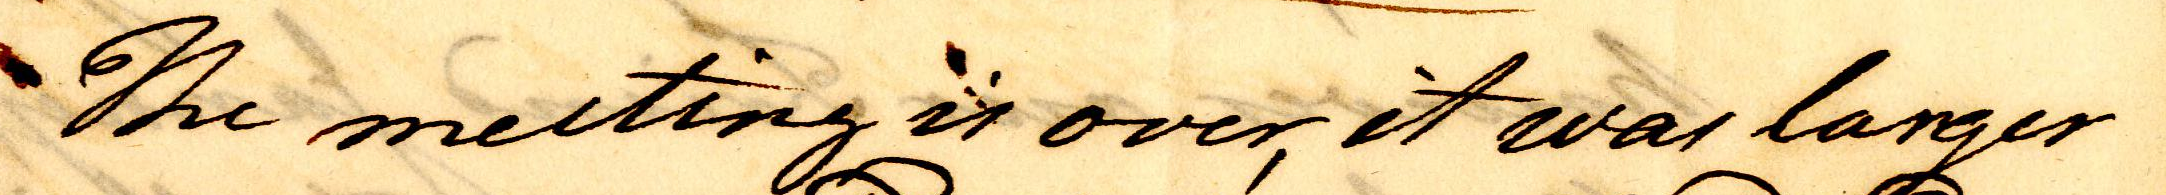The meeting is over, it was longer
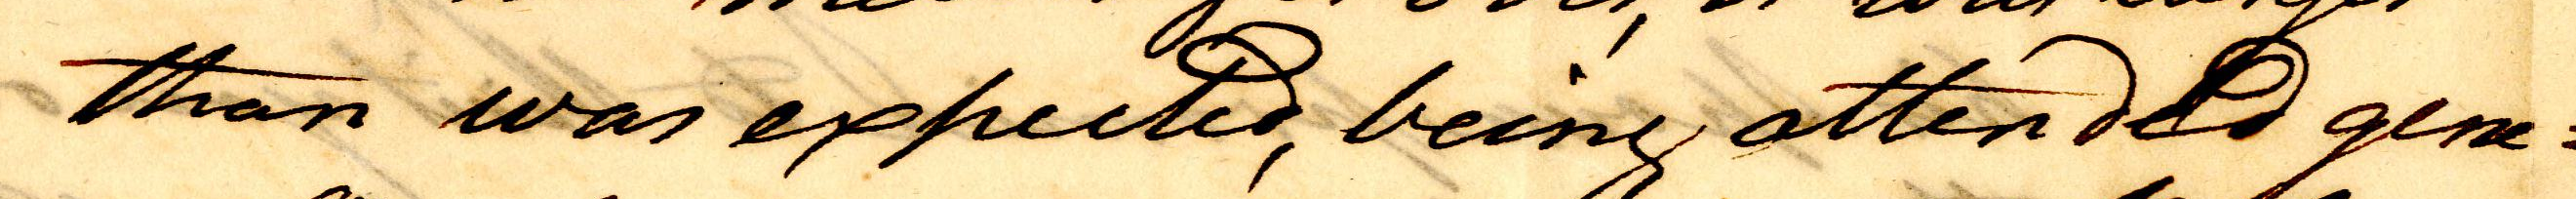than was expected, being attended gene-
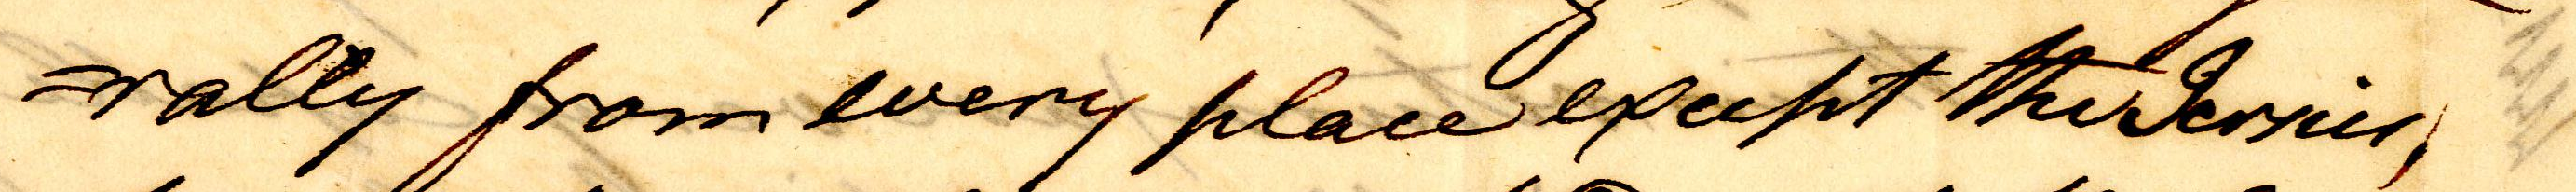-rally from every place except the Jersies,
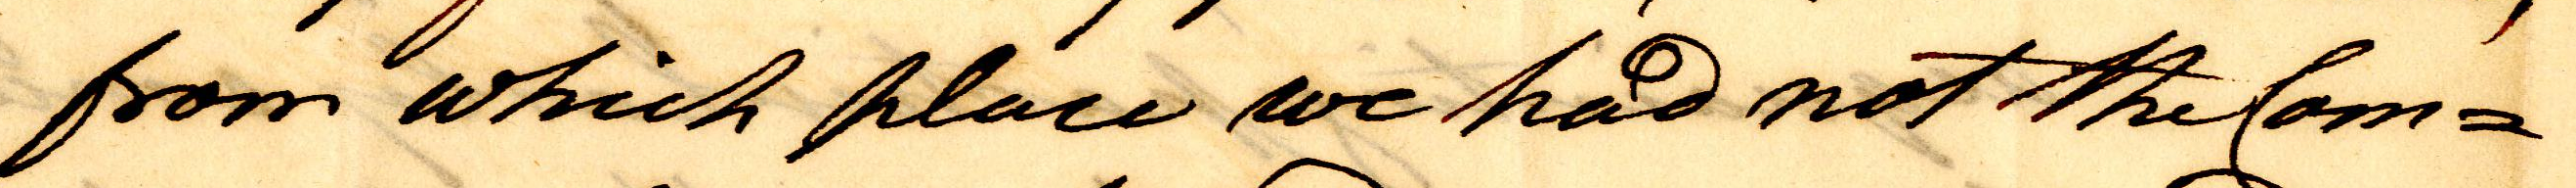from which place we had not the Com-
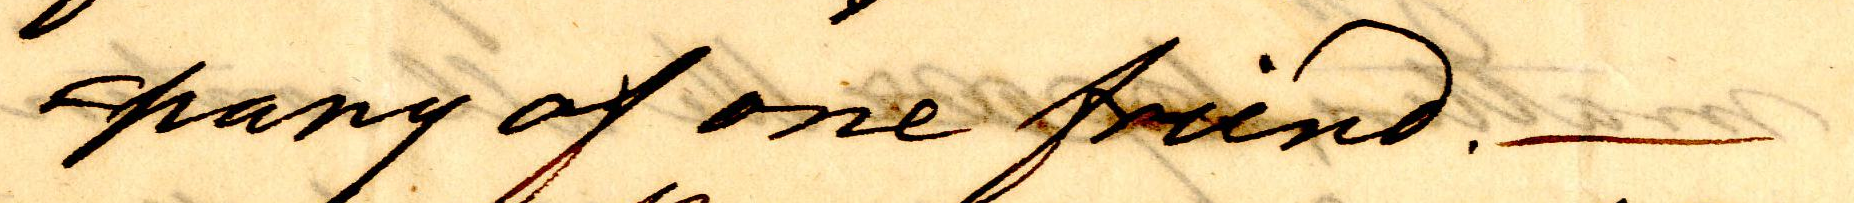-pany of one friend.-
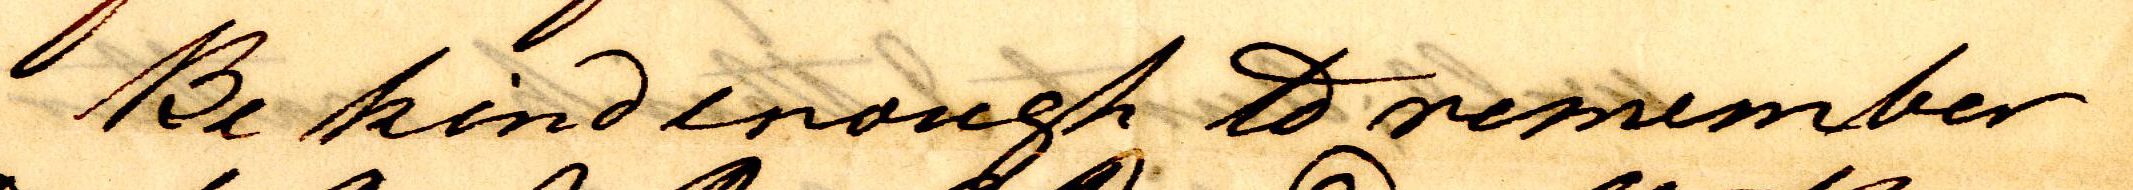Be kind enough to remember
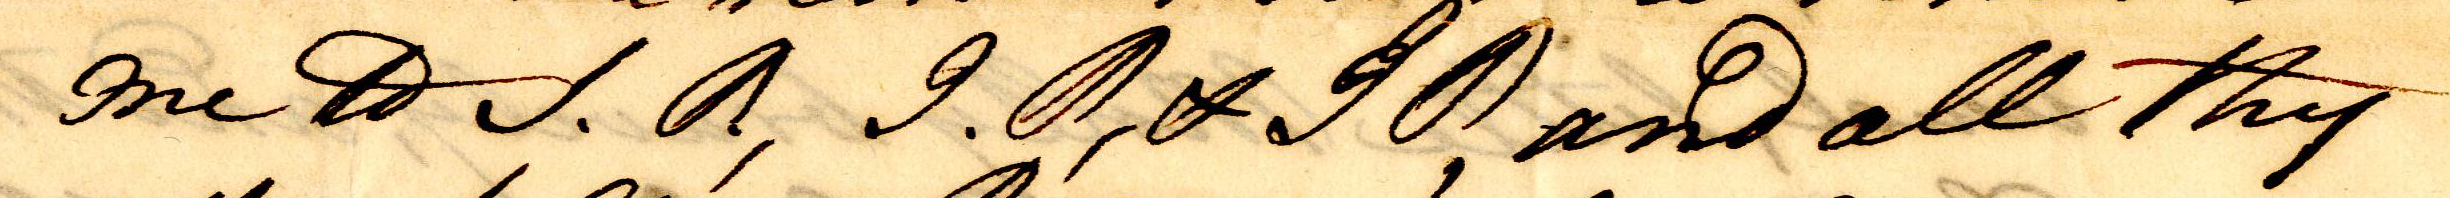me to S. P, J. P, & J P, and all thy
